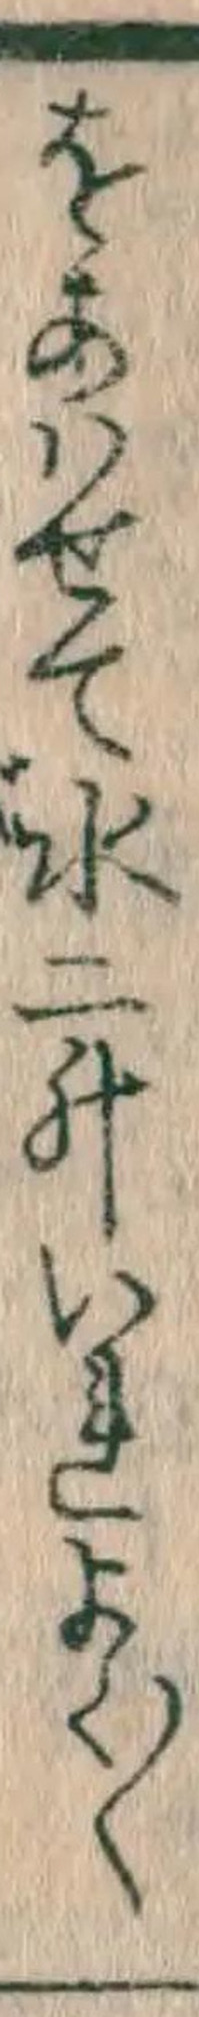をあはせて水二升いれよく〳〵
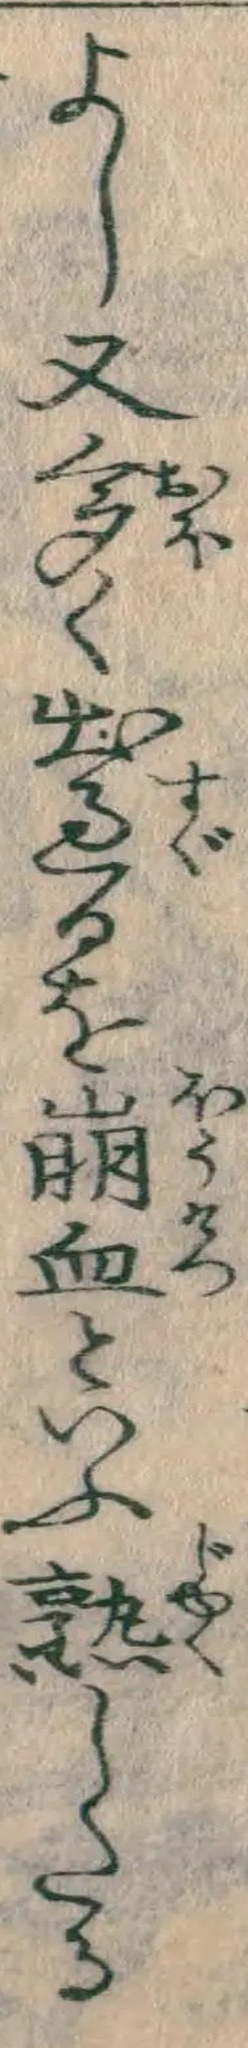よし又多く出過るを崩血といふ熟したる
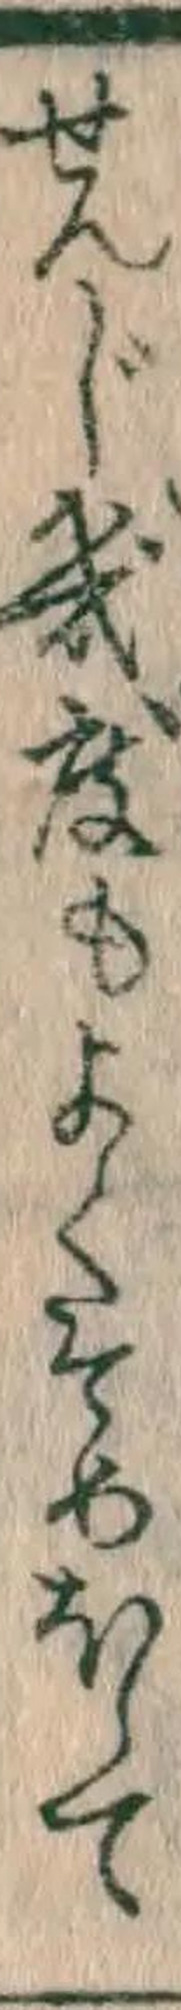せんじ幾度もよくそめほして
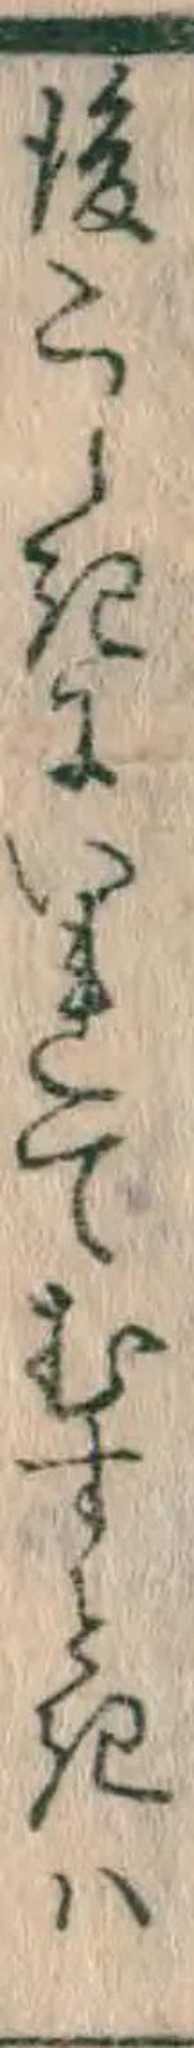後こしきにいれてむすときは
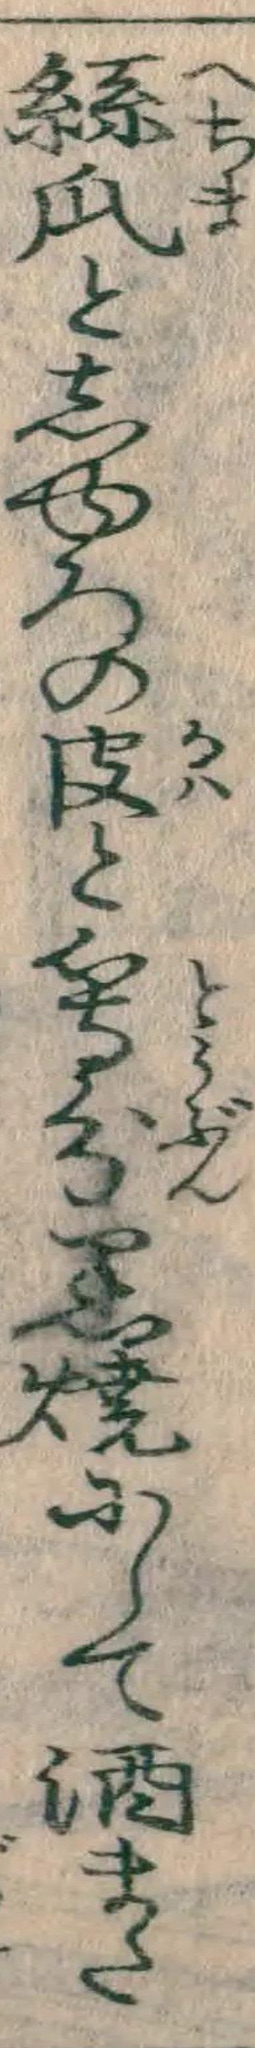糸瓜としゆろの皮と等分黒焼にして酒また
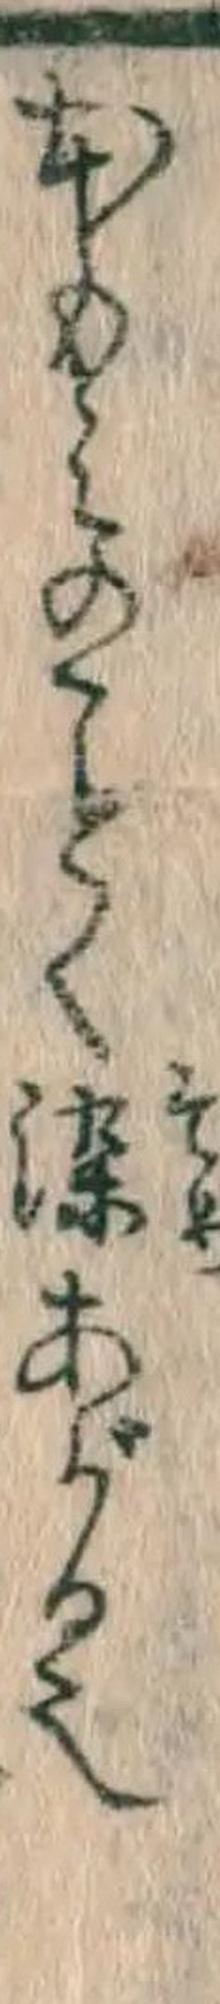本もみのことく染あがる也
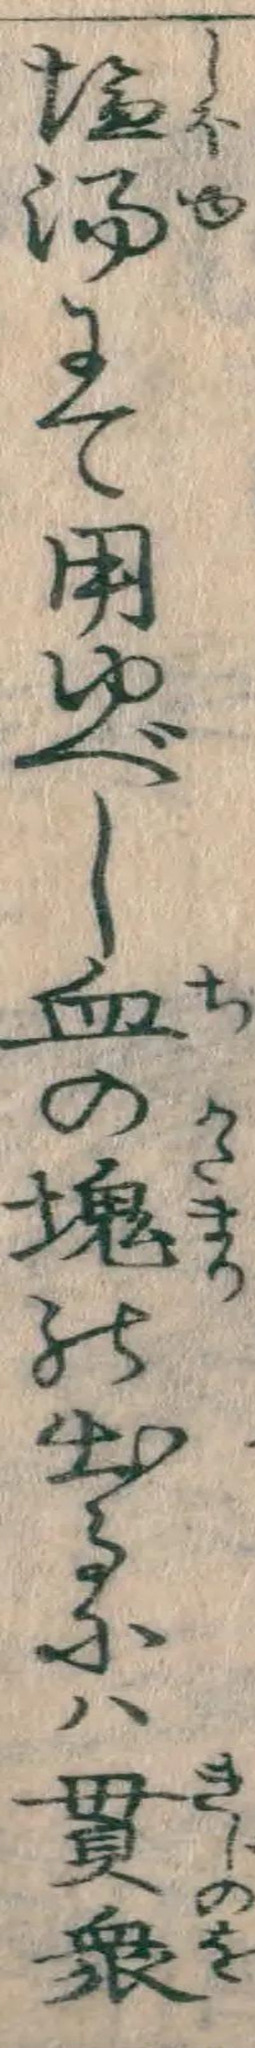塩湯にて用ゆべし血の塊の出るには貫衆
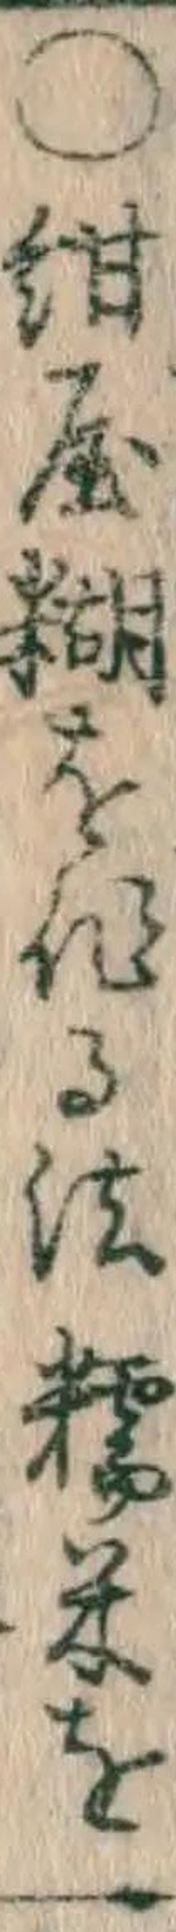○紺屋糊を作る法糯米を
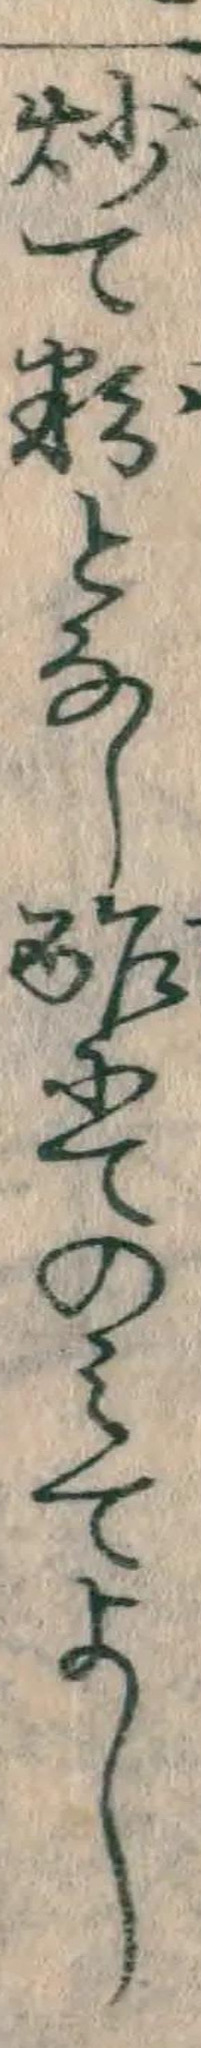炒て粉となし酢にてのみてよし
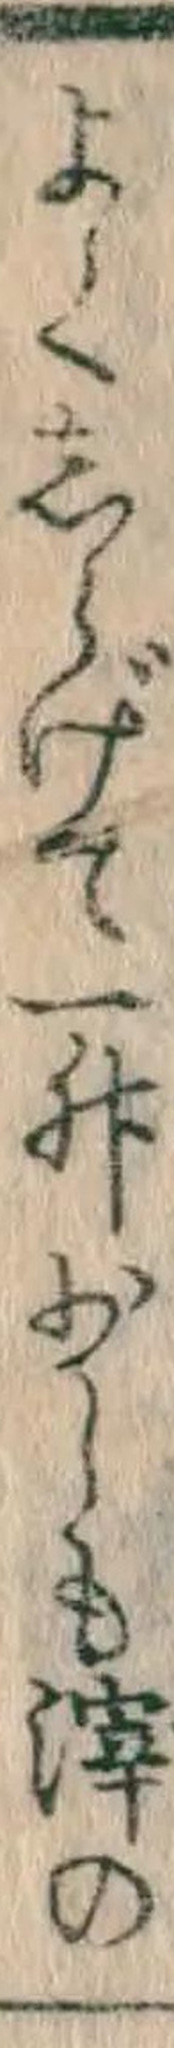よくしらげて一升少しも滓の
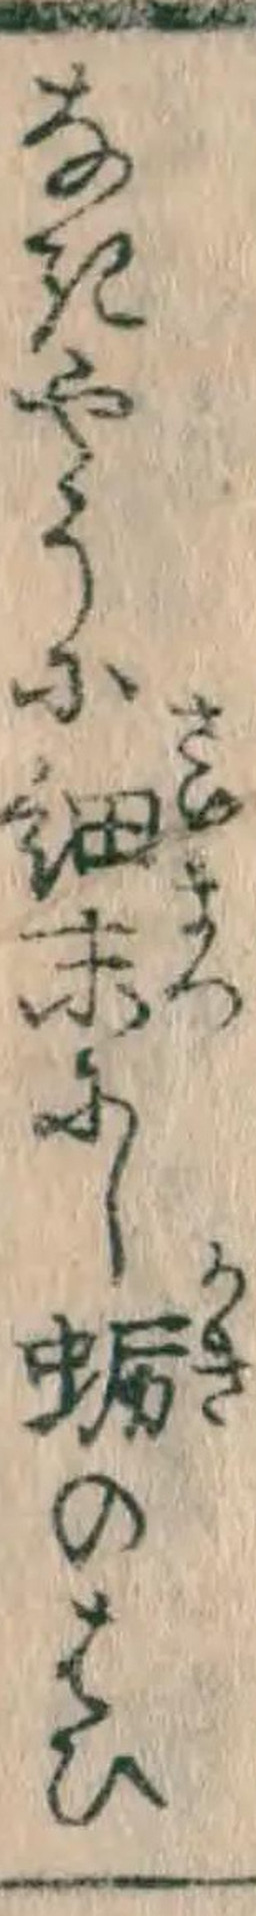なきやうに細末にし蠣のはひ
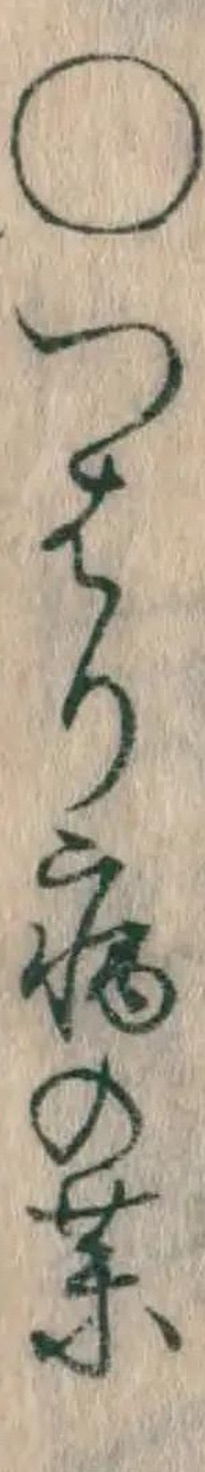○つはり病の薬
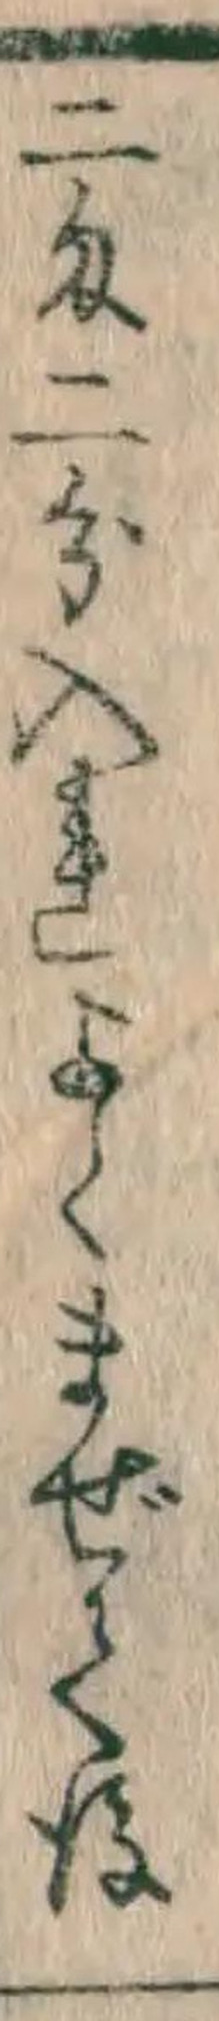二匁二分入れよくまぜて後
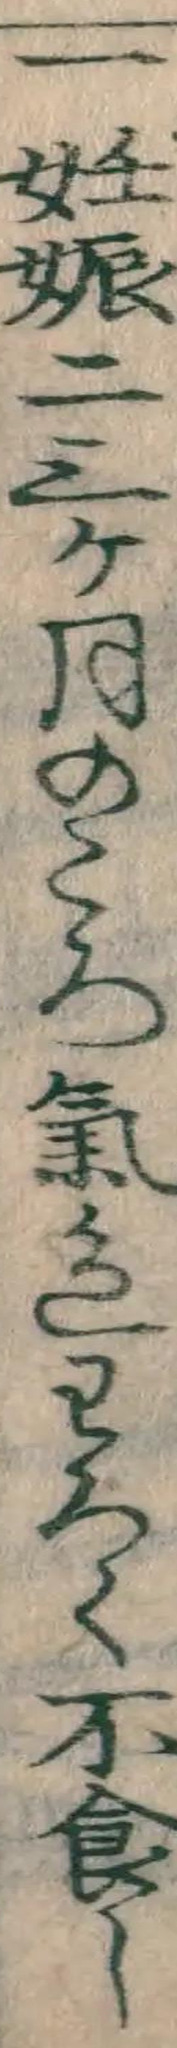一妊娠二三ヶ月のころ気色わろく不食し

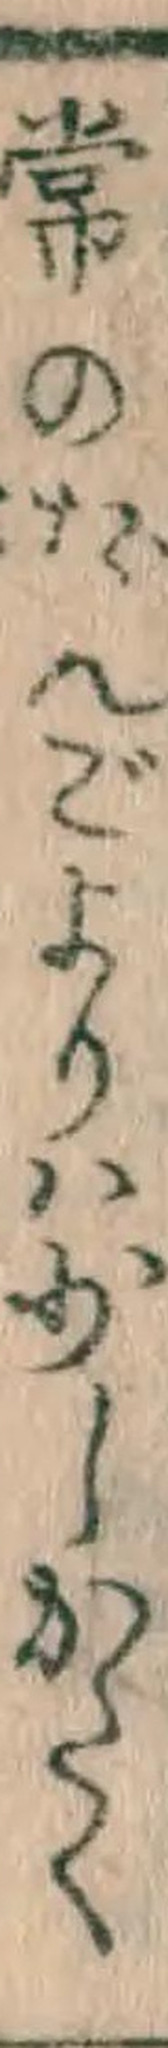常のだんごよりは少しかたく
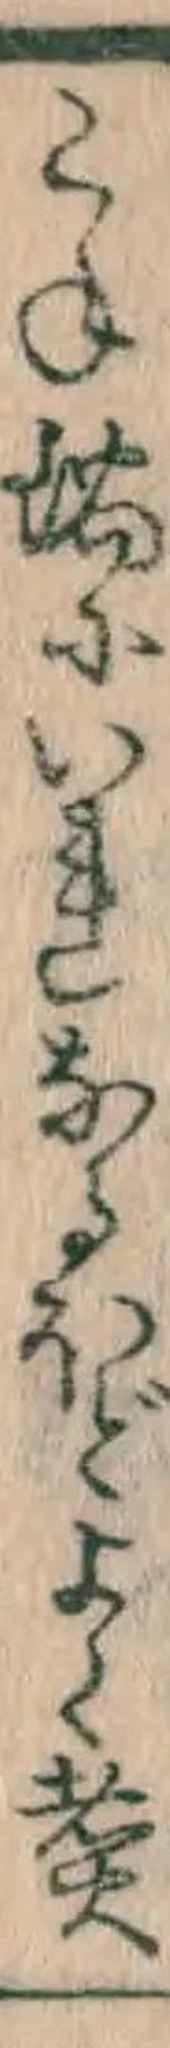こね鍋にいれなるほどよく煮
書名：広益秘事大全 3巻. [3]
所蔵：国立国会図書館 National Diet Library, JAPAN
